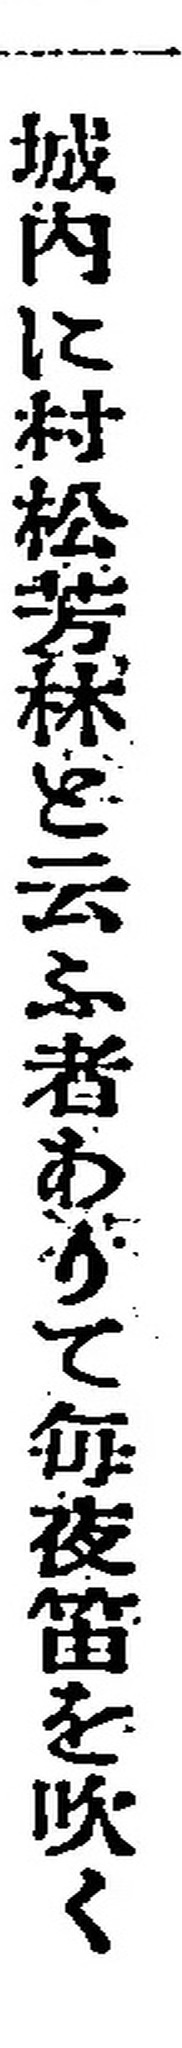城内に村松芳林と云ふ者ありて毎夜笛を吹く
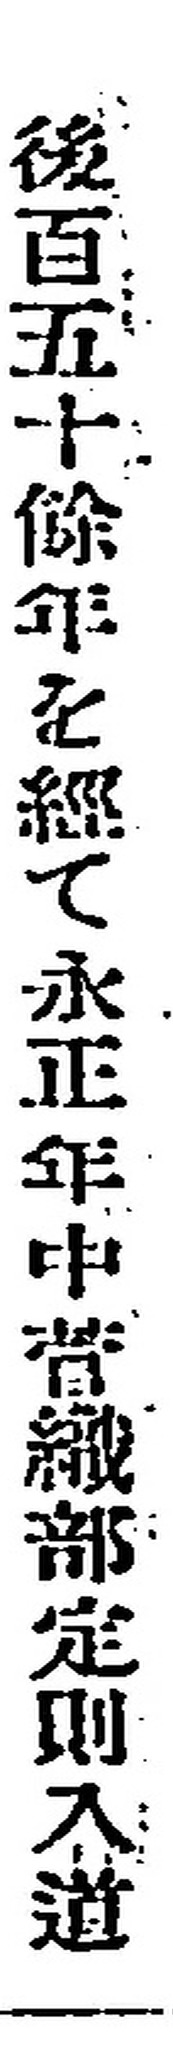後百五十余年を経て永正年中菅織部定則入道
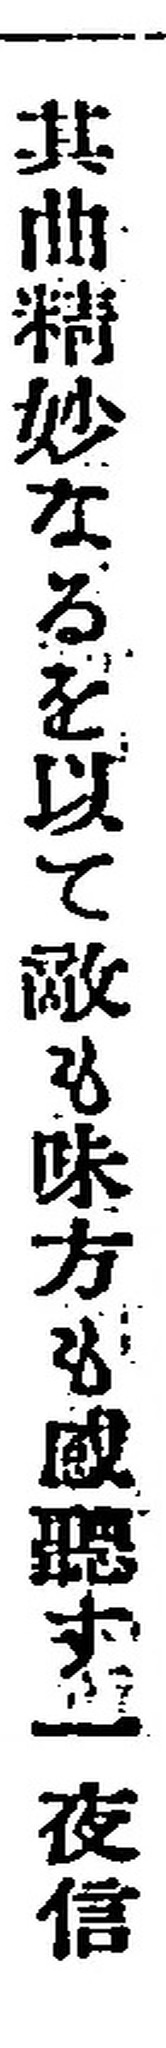其曲精妙なるを以て敵も味方も感聴す一夜信
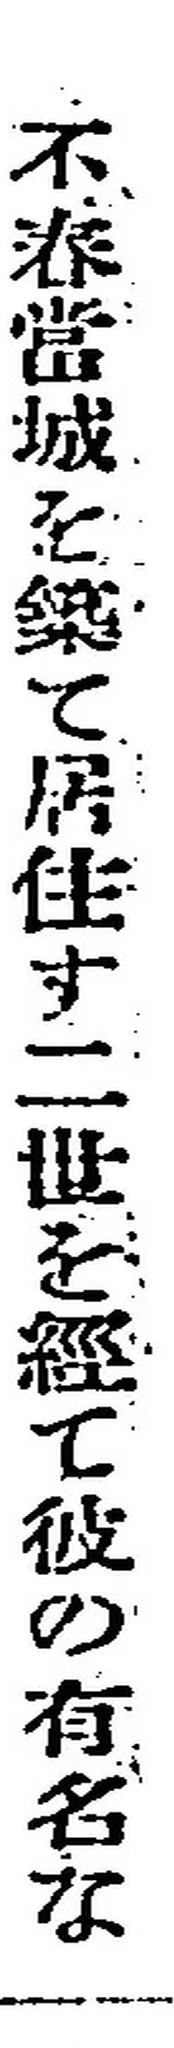不春当城を築て居住す二世を経て彼の有名な
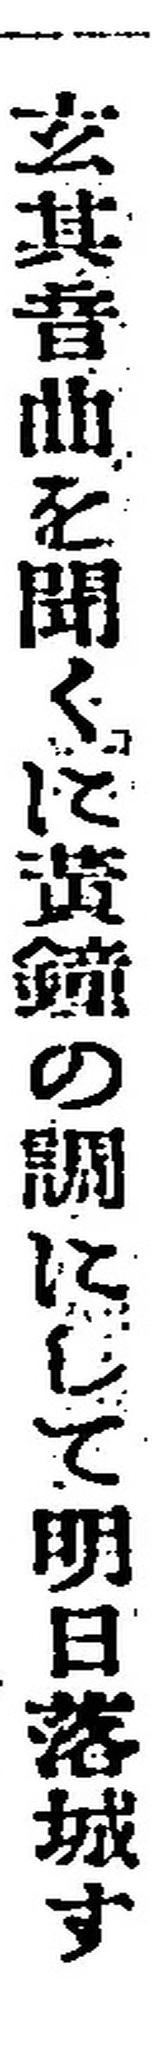玄其音曲を聞くに黄鐘の調にして明日落城す
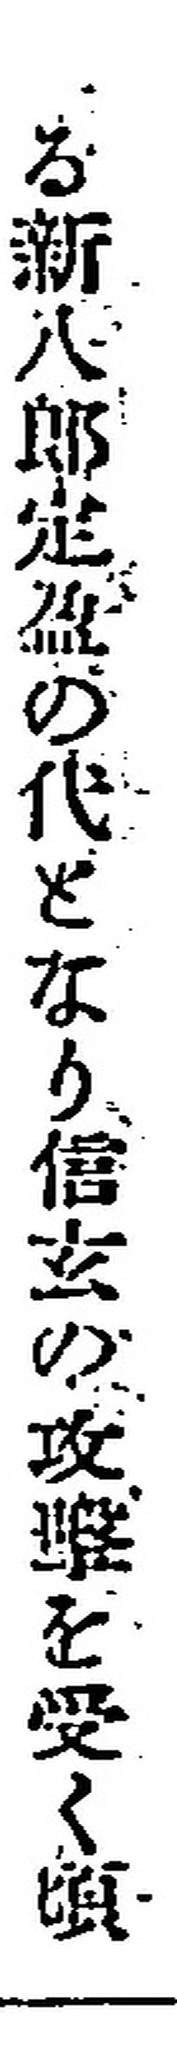る新八郎定盈の代となり信玄の攻撃を受く頃
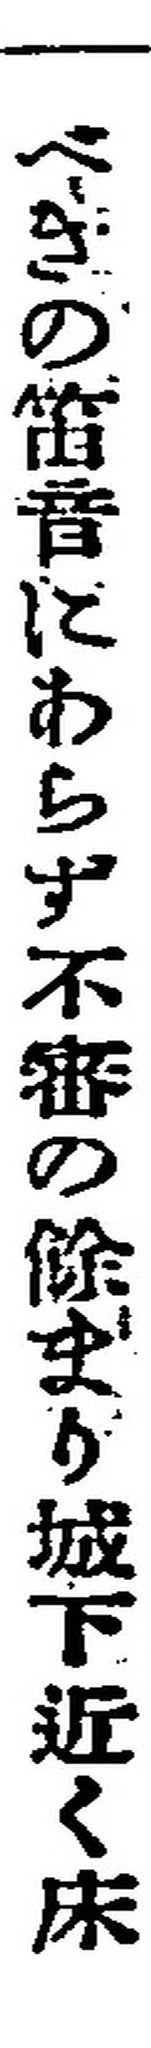べきの笛音にあらず不審の余まり城下近く床
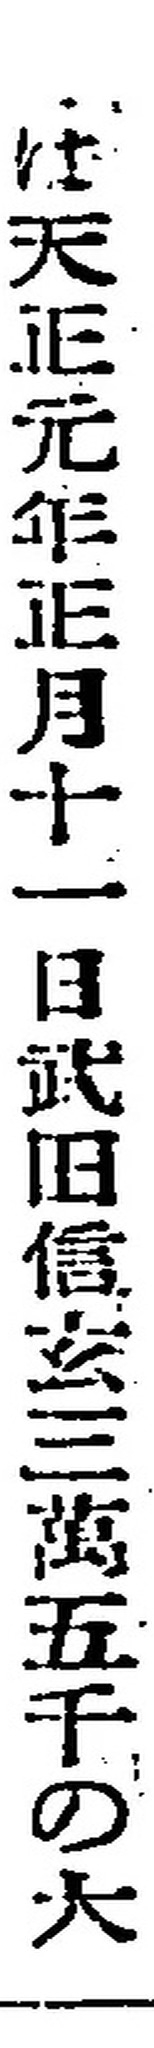は天正元年正月十一日武田信玄三万五千の大
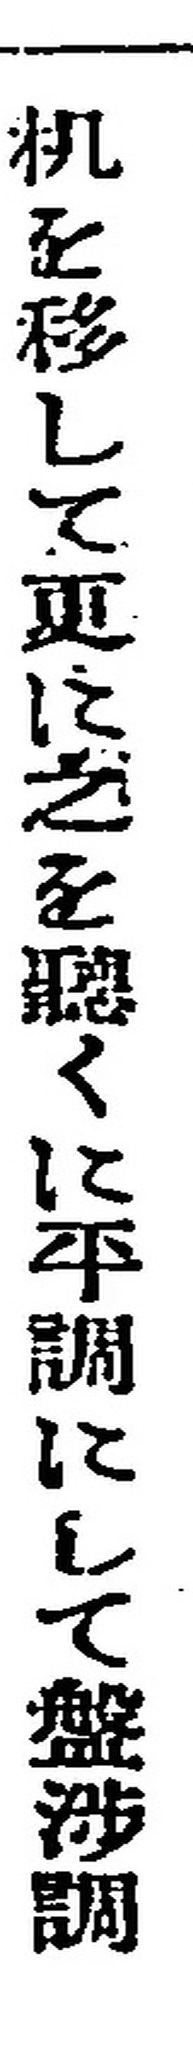机を移して更に之を聴くに平調にして盤渉調
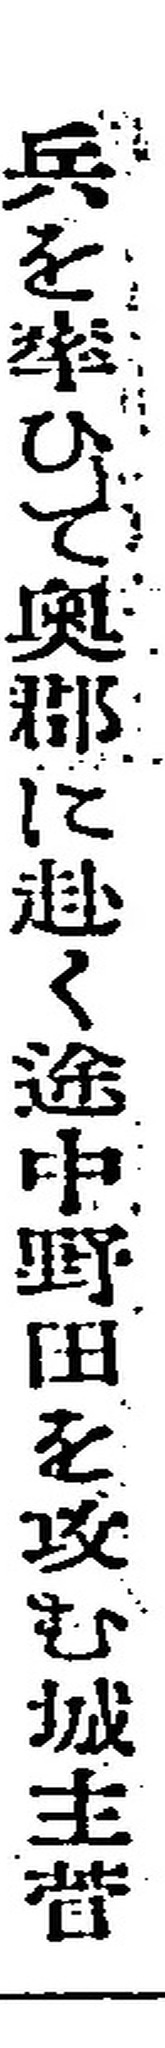兵を率ひて奥郡に赴く途中野田を攻む城主菅
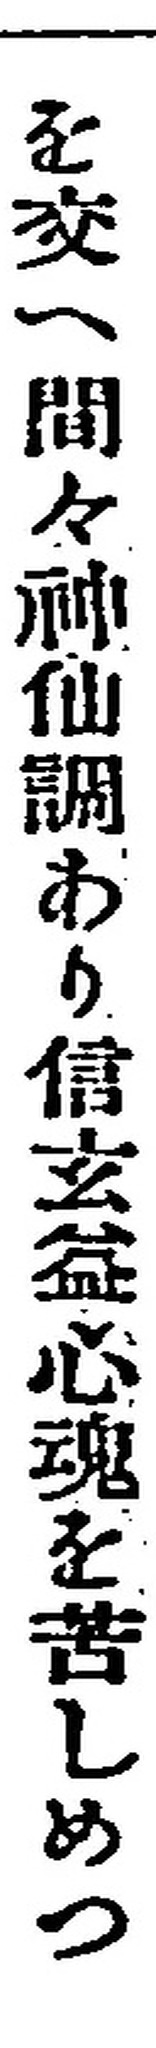を交へ間々神仙調あり信玄益心魂を苦しめつ
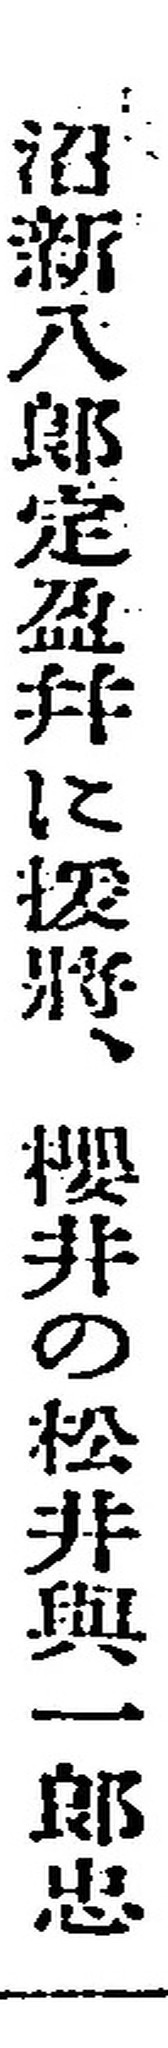沼新八郎定盈并に援将、桜井の松井与一郎忠
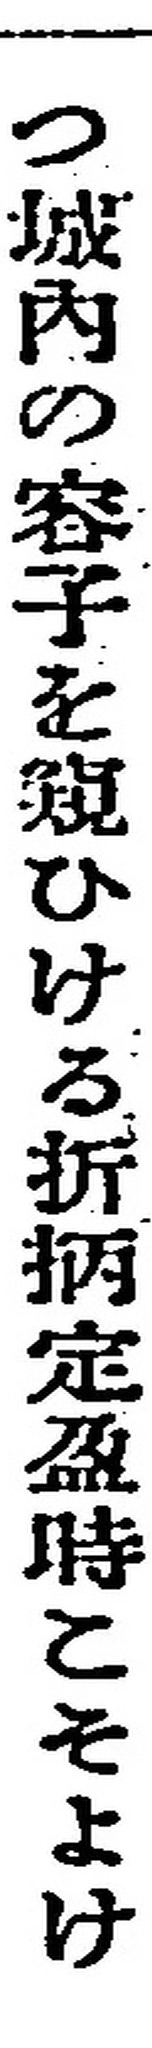つ城内の容子を窺ひける折抦定盈時こそよけ
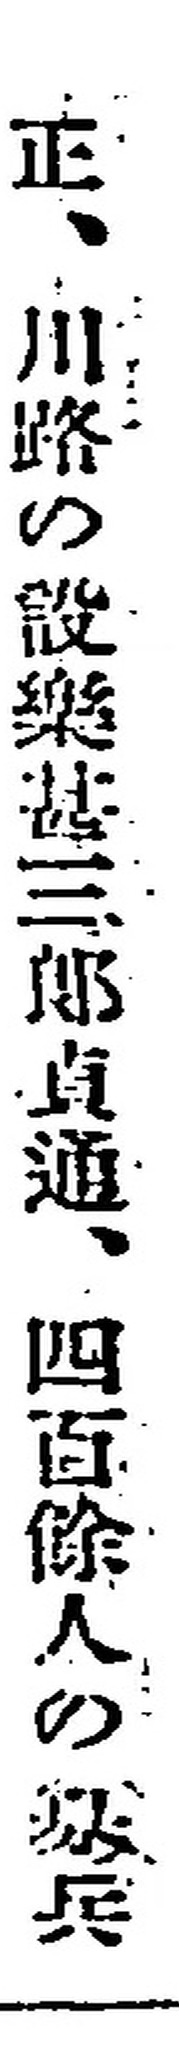正、川路の設楽甚三郎貞通、四百余人の寡兵
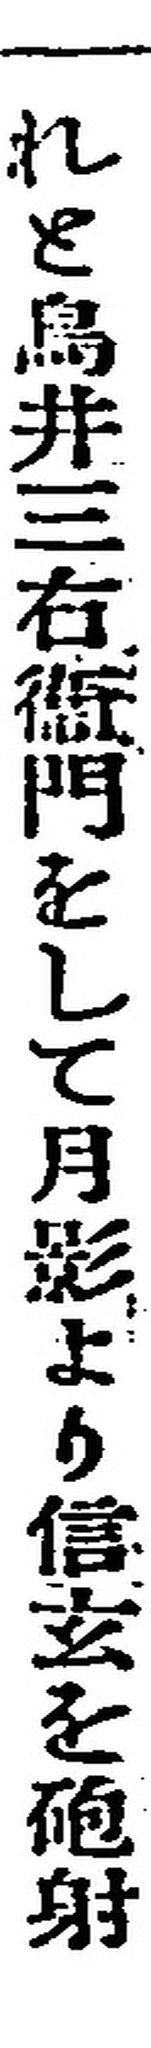れと鳥井三右衛門をして月影より信玄を砲射
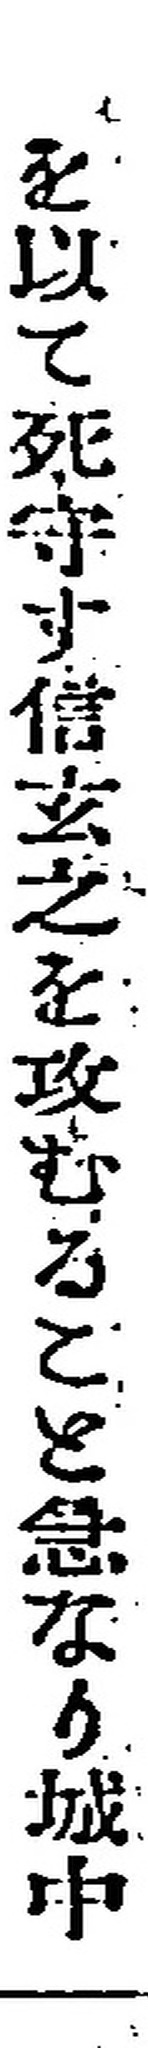を以て死守す信玄之を攻むること急なり城中
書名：東参名勝案内
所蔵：国立国会図書館 National Diet Library, JAPAN
